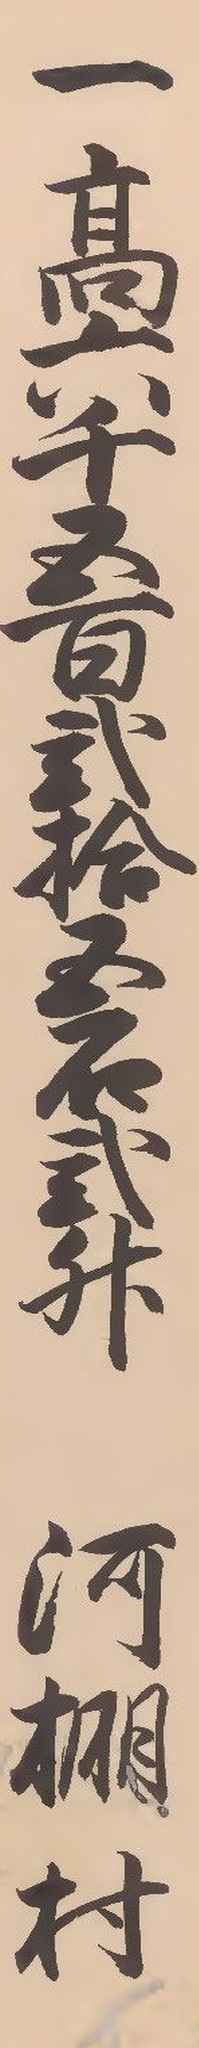一高六千五百弐拾五石弐升河棚村
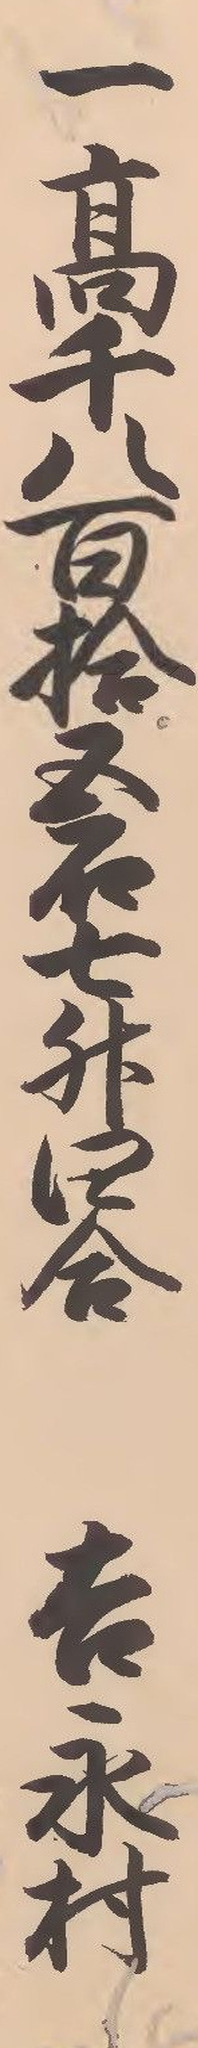一高千八百拾五石七升四合吉永村

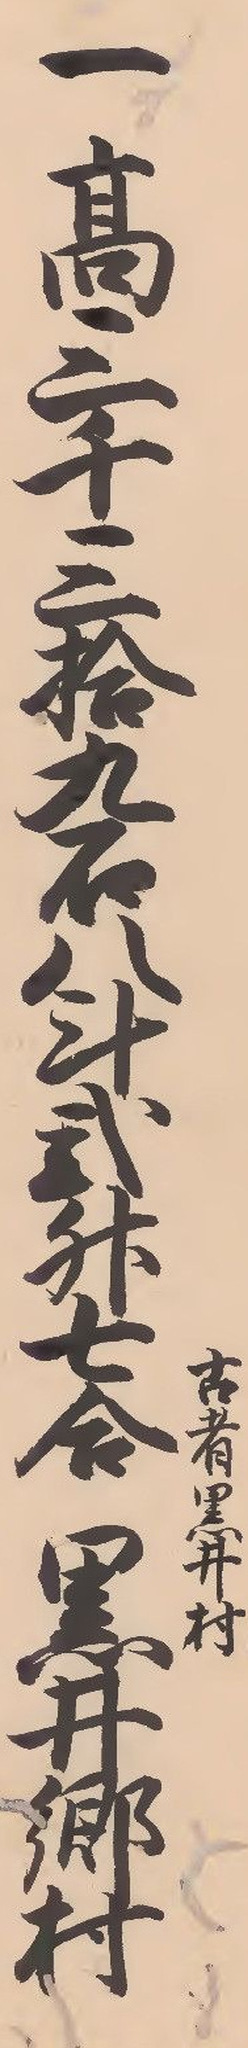一高三千三拾九石八斗弐升七合黒井郷村
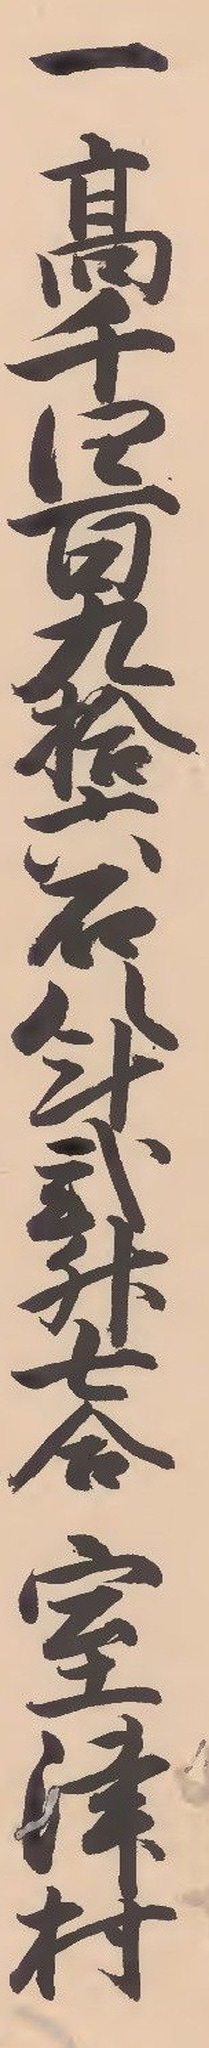一高千四百九拾六石八斗弐升七合室津村
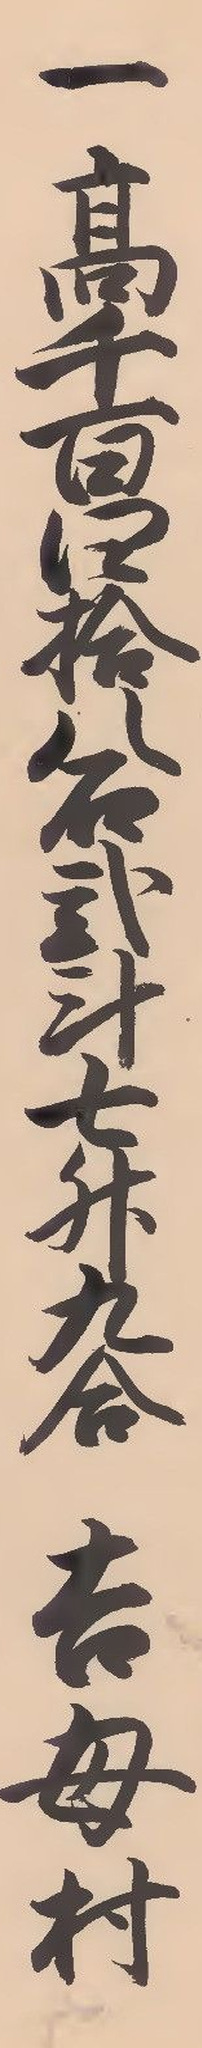一高千百四拾八石弐斗七升九合吉母村
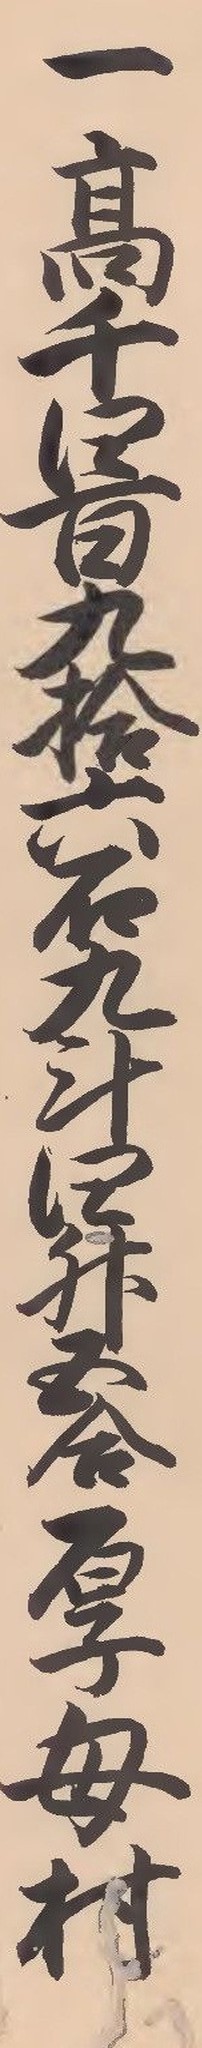一高千四百九拾六石九斗四升五合厚母村
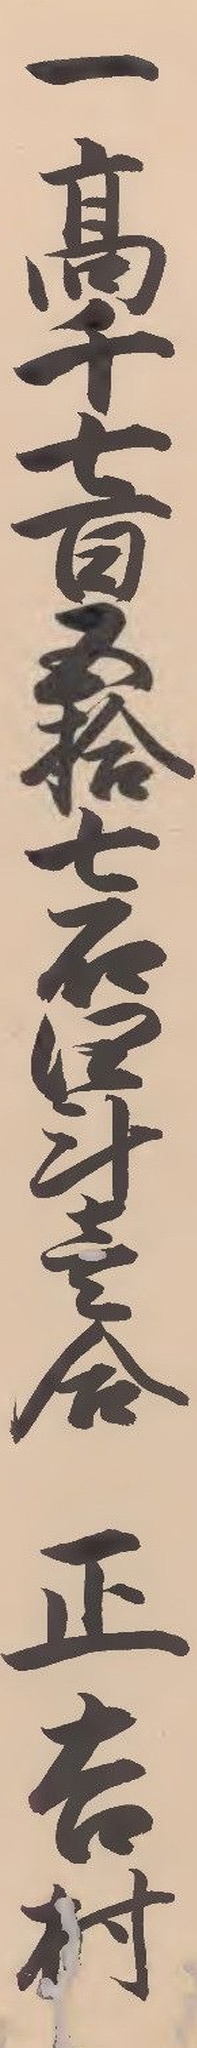一高千七百五拾七石四斗壱合正吉村
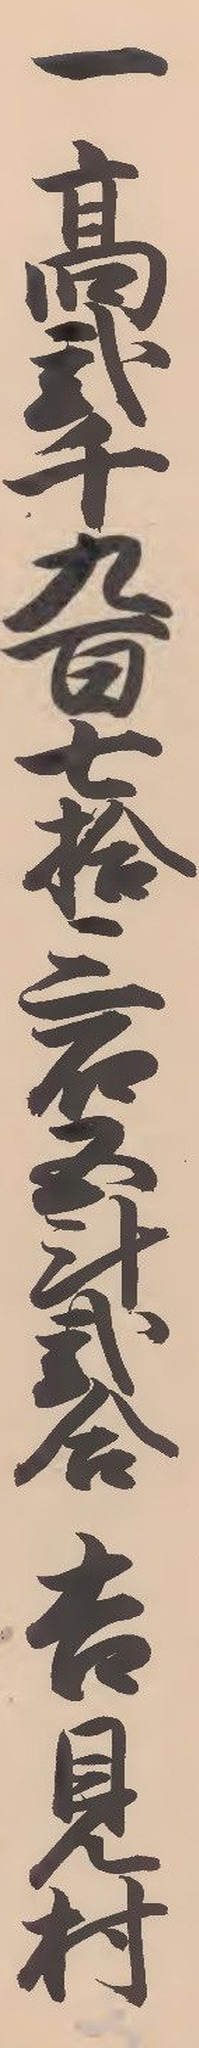一高弐千九百七拾三石五斗弐合吉見村
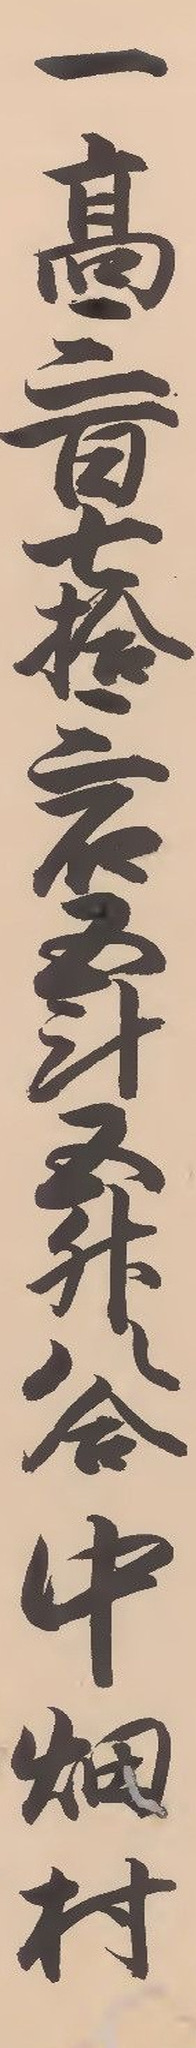一高三百七拾三石五斗五升八合中畑村
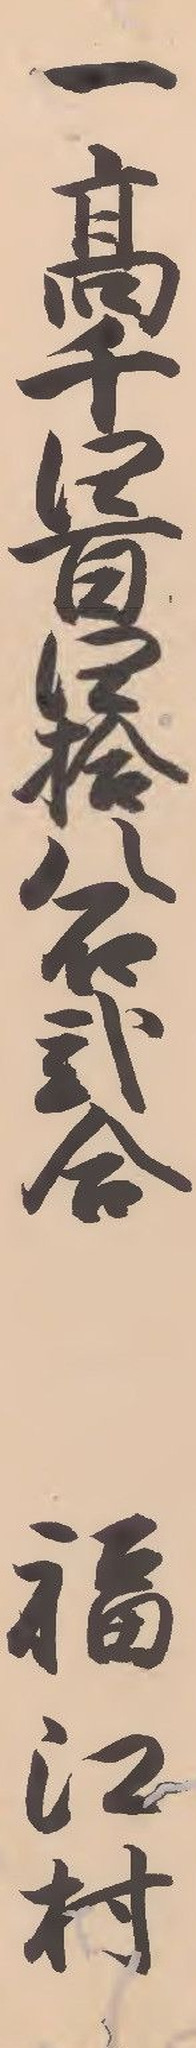一高千四百四拾八石弐合福江村

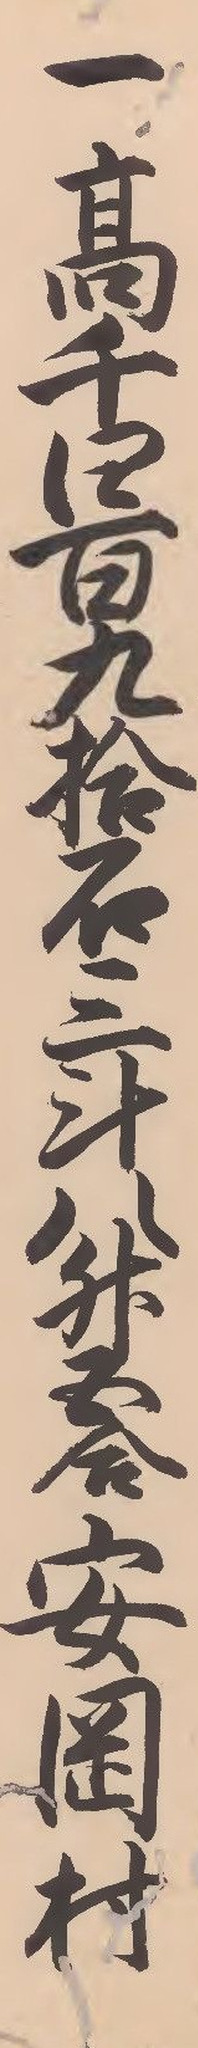一高千四百九拾石三斗八升五合安岡村
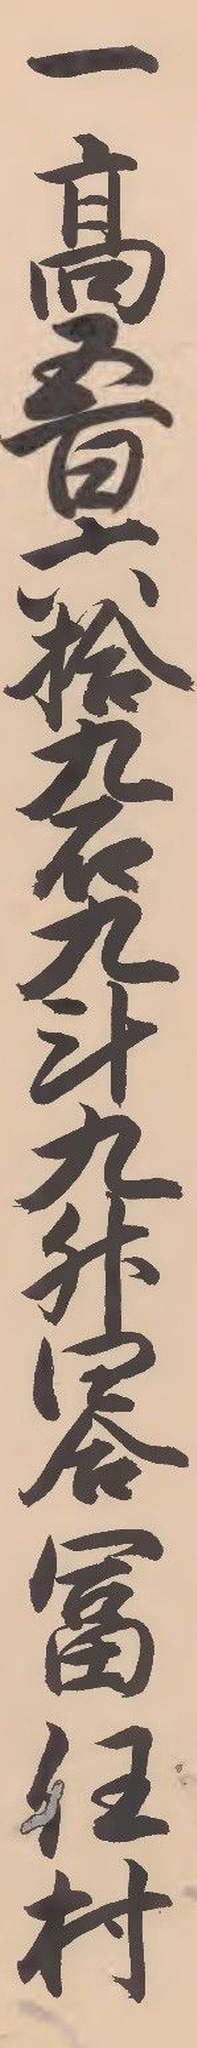一高五百六拾九石九斗九升四合冨任村
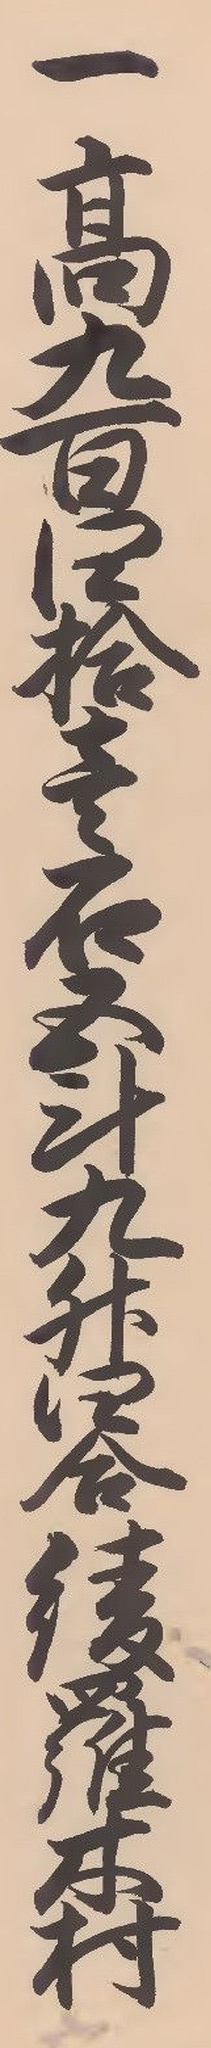一高九百四拾壱石五斗九升四合綾羅木村
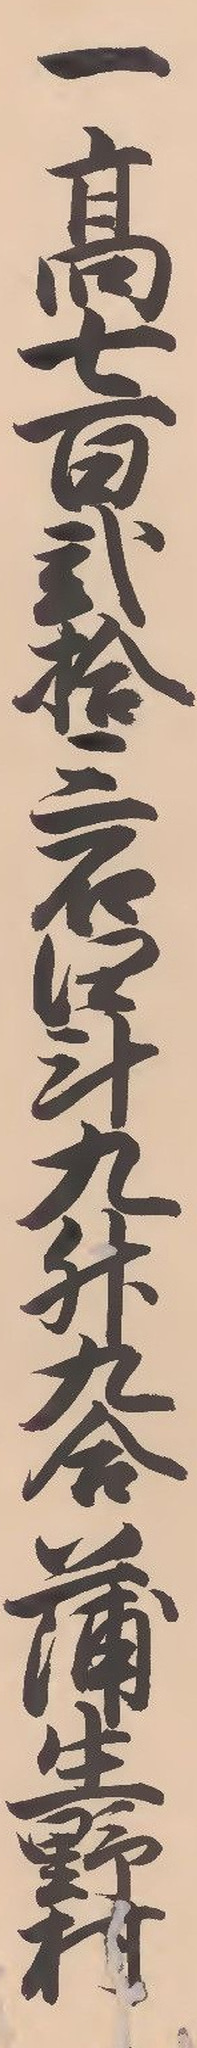一高七百弐拾三石四斗九升九合蒲生野村
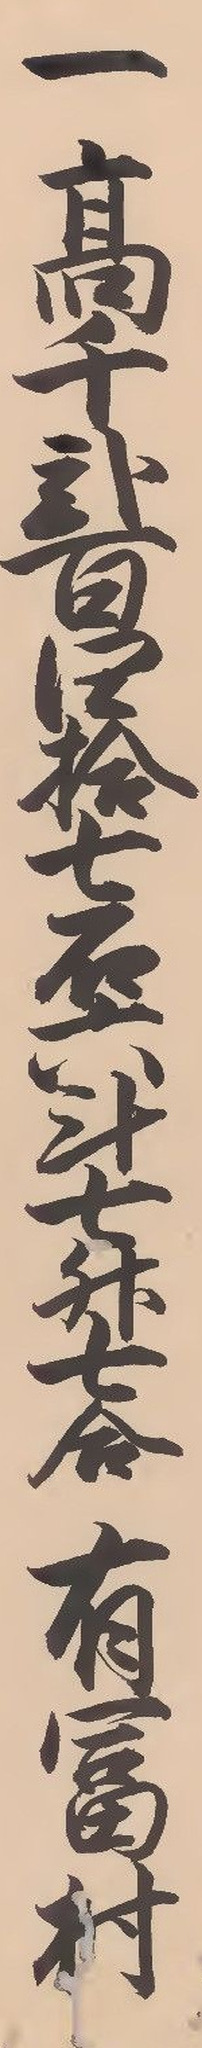一高千弐百四拾七石六斗七升七合有冨村
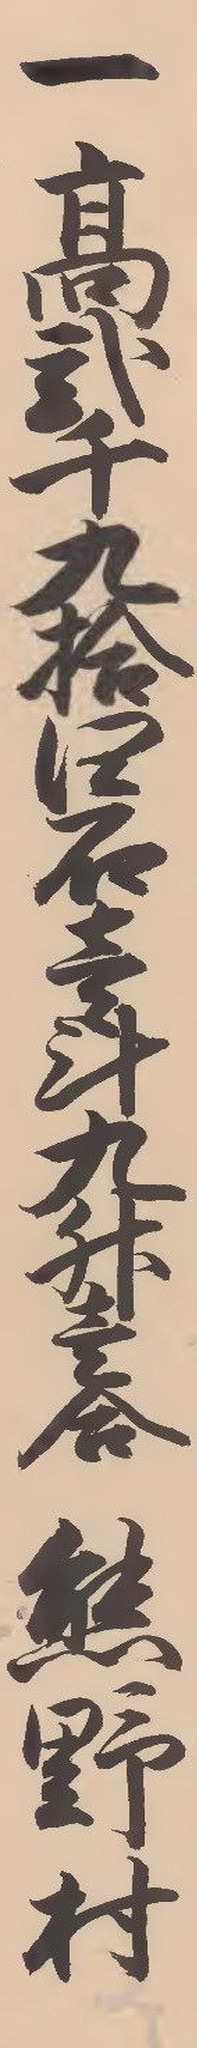一高弐千九拾四石壱斗九升壱合熊野村
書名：長門国郷帳
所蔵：国立公文書館 National Archives of Japan
